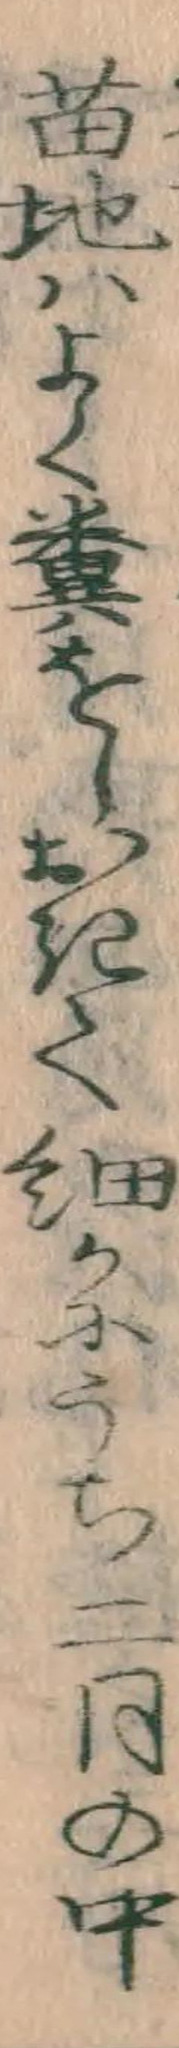苗地はよく糞をしおきて細かにうち二月の中
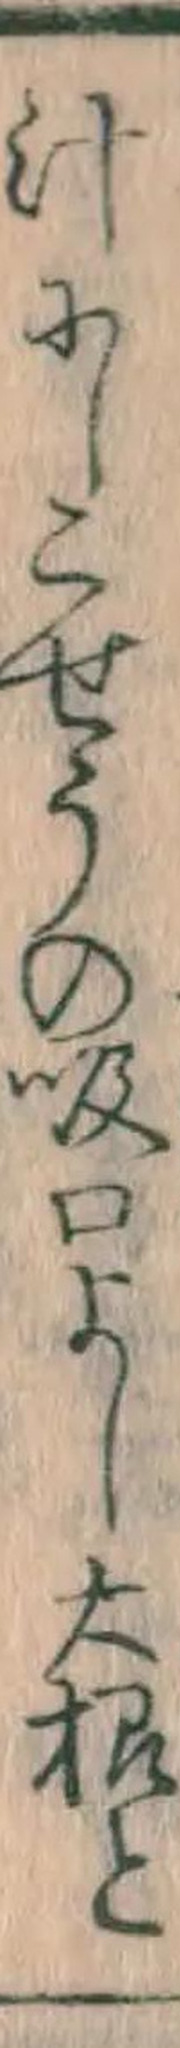汁にしこせうの吸口よし大根と
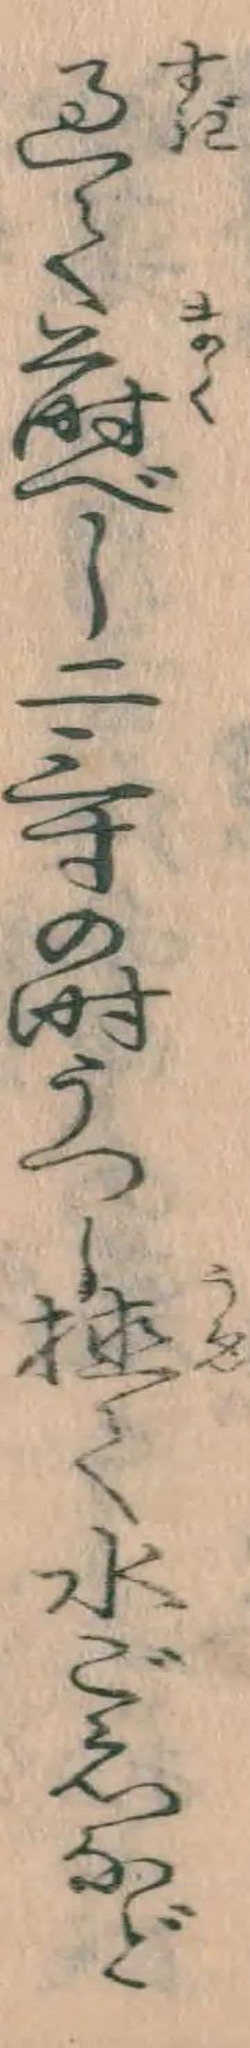過て蒔べし二三寸の時うつし植て水ごえなど
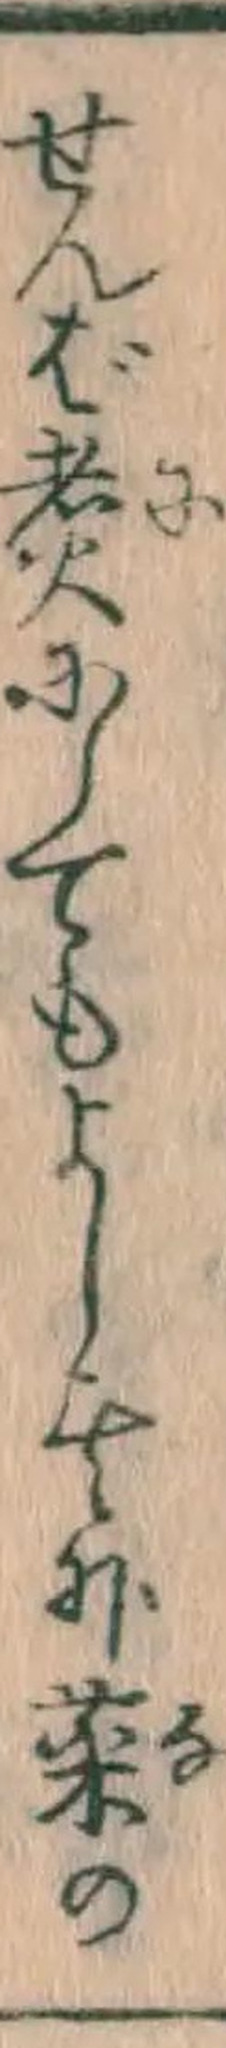せんば煮にしてもよし其外菜の
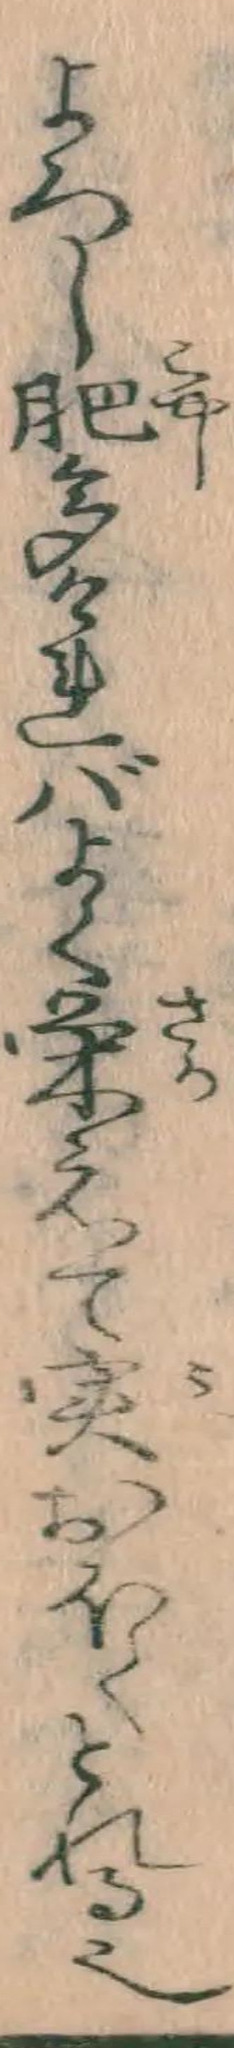よろし肥多ければよく栄えて実おほくとれる也
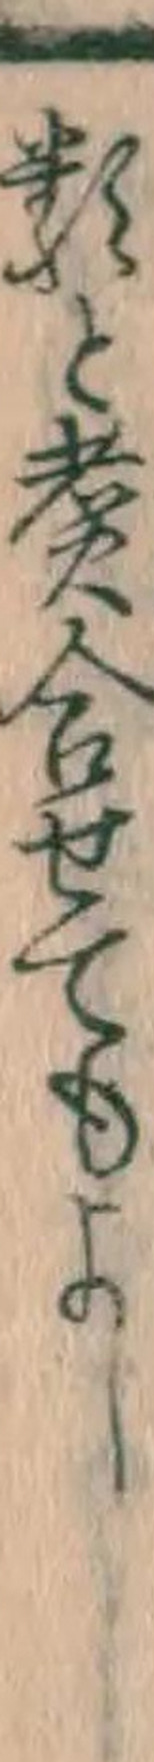類と煮合せてもよし
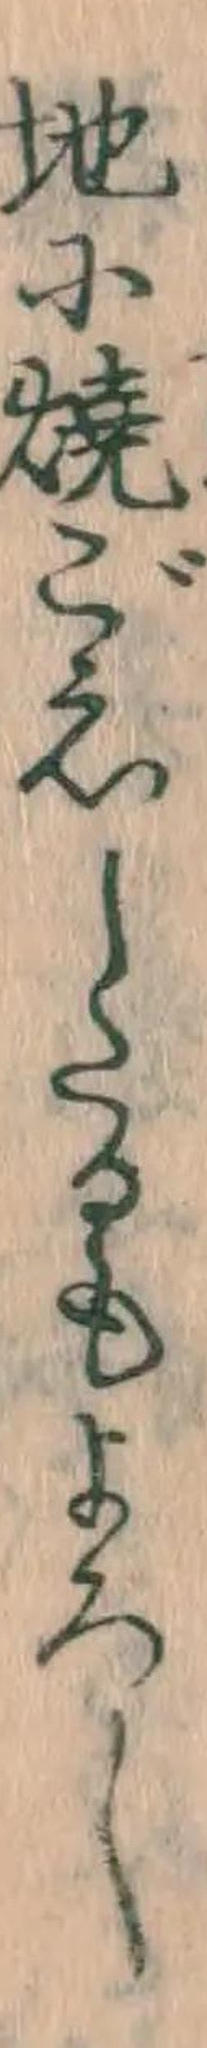地に焼ごえしたるもよろし
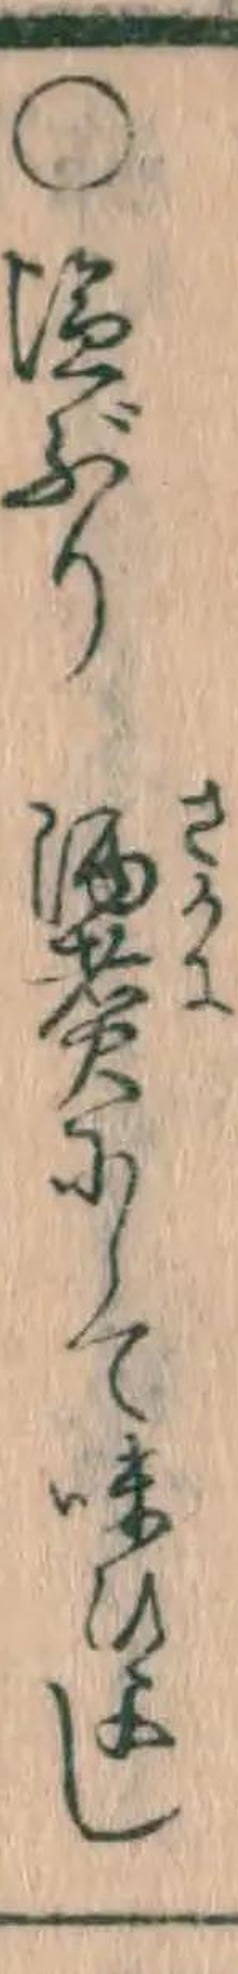○塩ぶり酒煮にして味ひよし
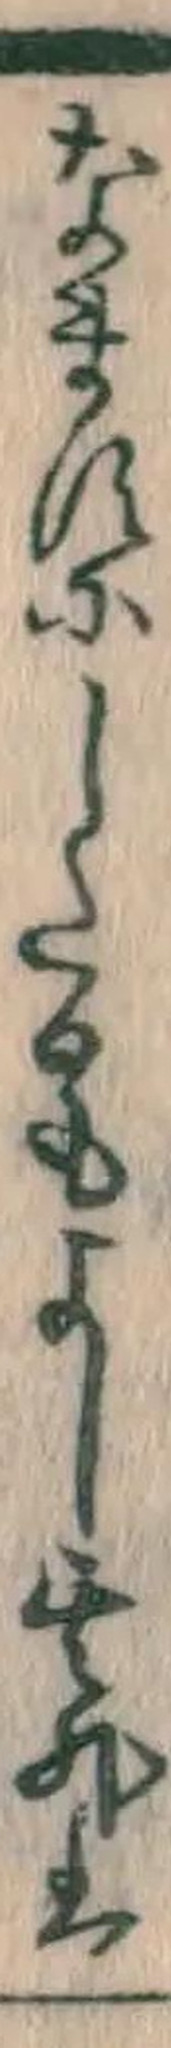なますにしたるもよし其外は
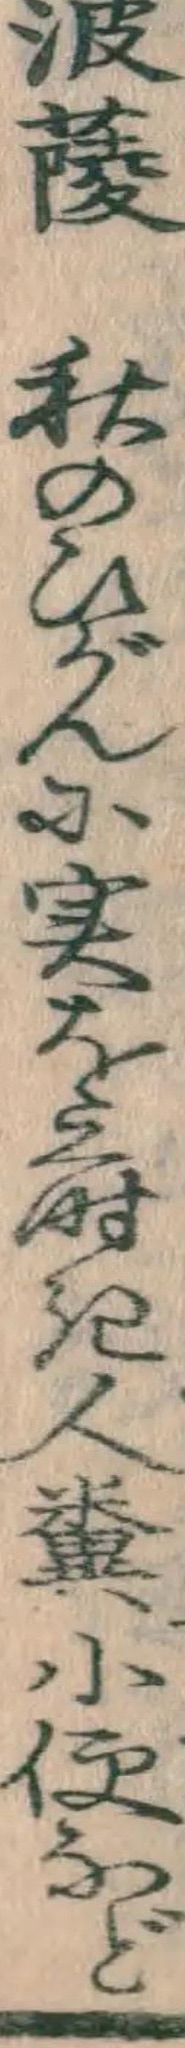一菠䔖秋のひがんに実を蒔き人糞小便など
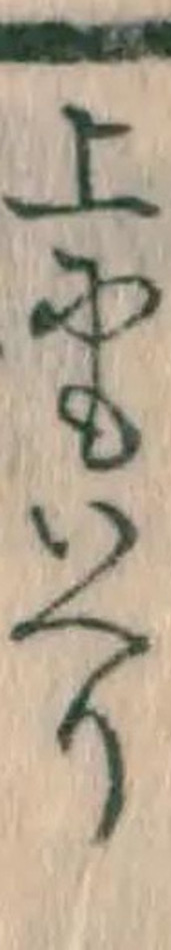上にもいへり
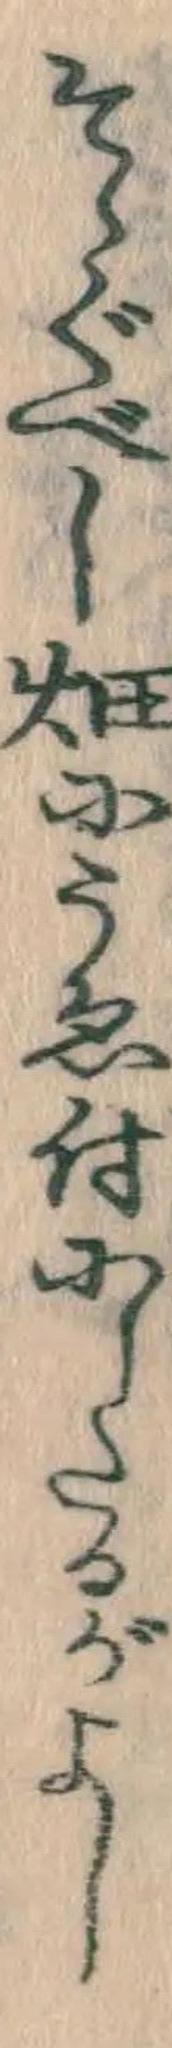そゝぐべし畑にうゑ付にしたるがよし
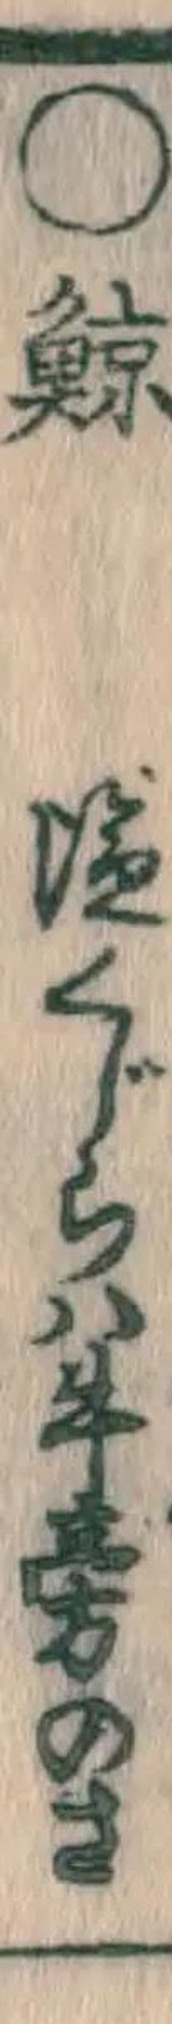○鯨塩くじらは牛蒡のさ
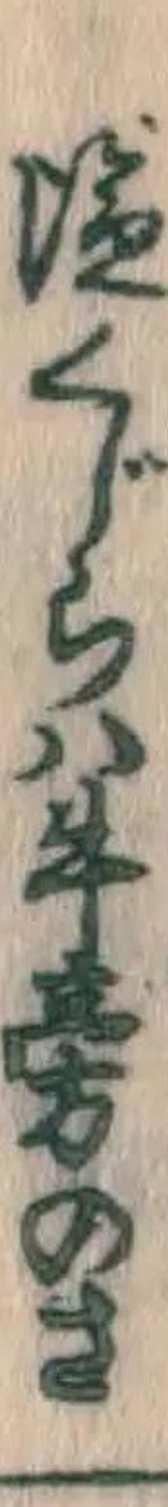○鯨塩くじらは牛蒡のさ
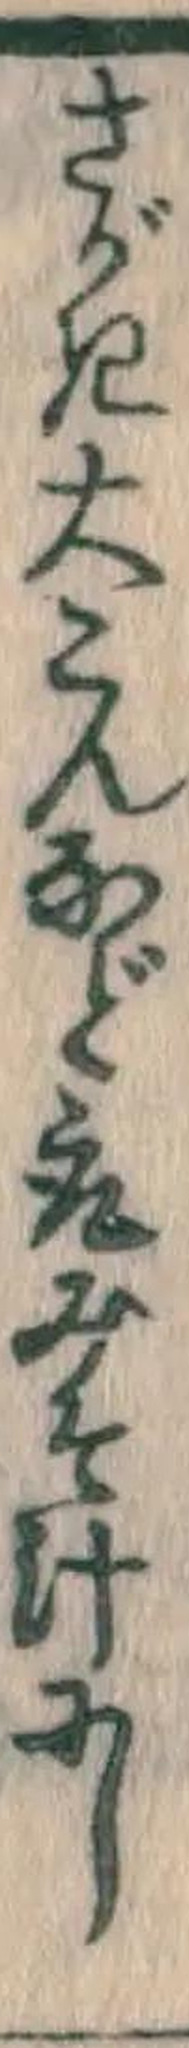さがき大こんなど取みそ汁にし
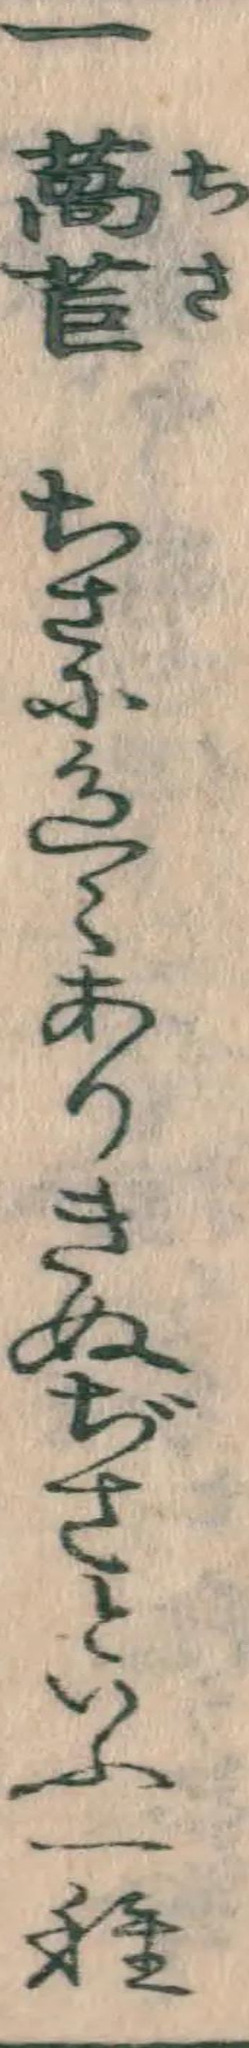一萵苣ちさに色々ありきぬぢさといふ一種
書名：広益秘事大全 3巻. [5]
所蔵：国立国会図書館 National Diet Library, JAPAN
